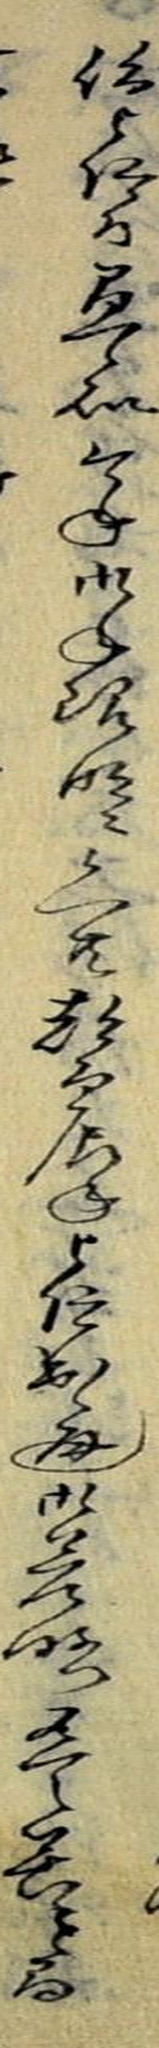儀被仰付置候処今年御年限明に候へ共都而辰年被仰出候通御差略有之筈に候間
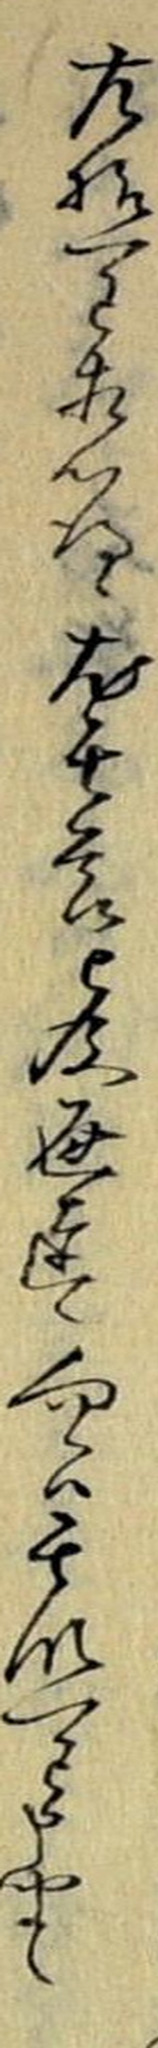左様可被相心得候尤其節被及通達候向へは其段可被申聞候
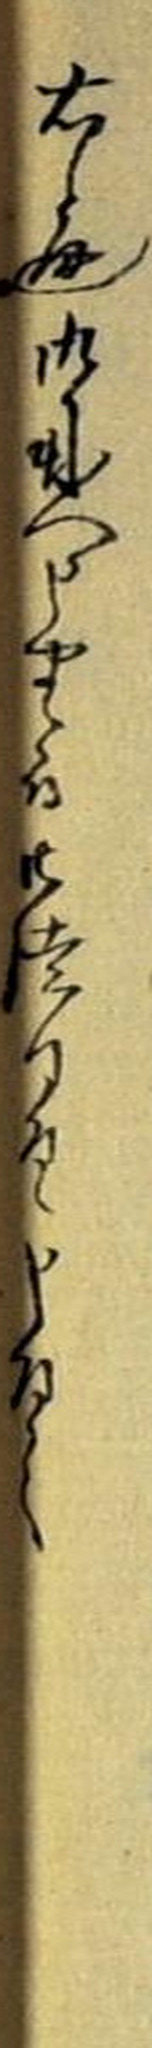右之通御用人申聞候に付御徒目付へ申付之
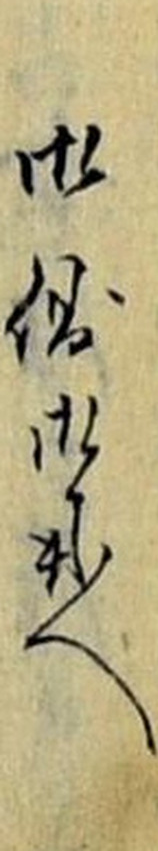御側御用人
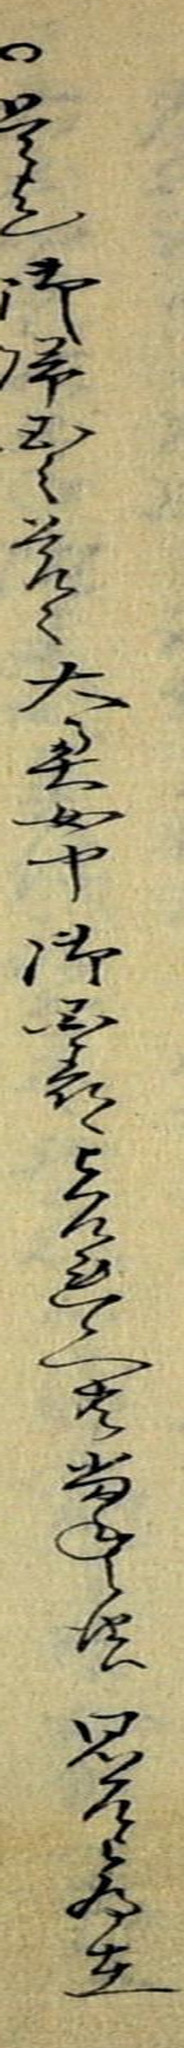○是迄御帰国之節々大奥女中御国表へ被召連候へ共当年之儀は思召被為在
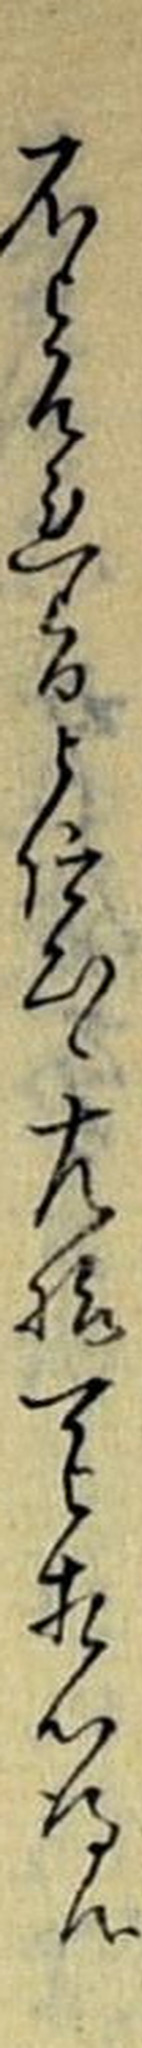不被召連旨被仰出候左様可被相心得候
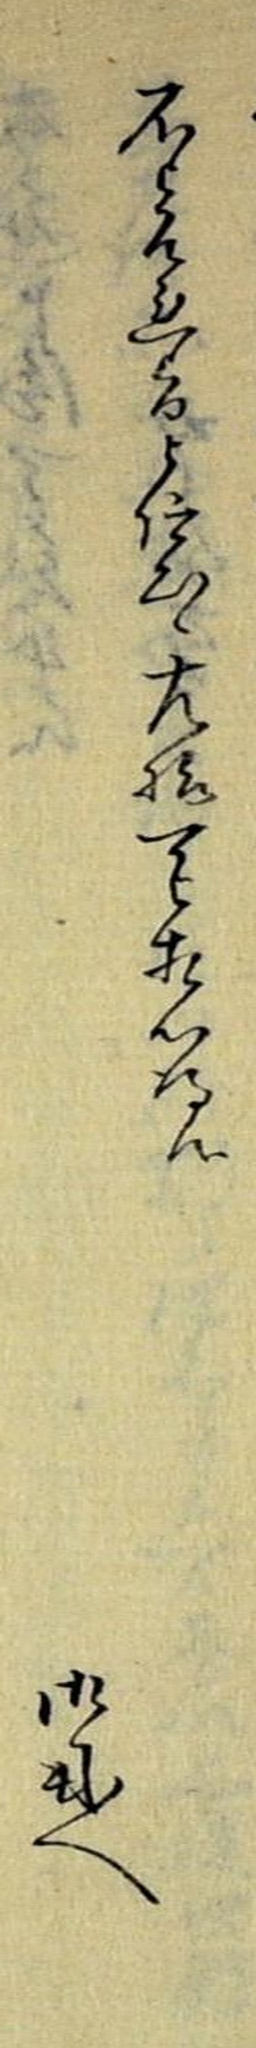不被召連旨被仰出候左様可被相心得候
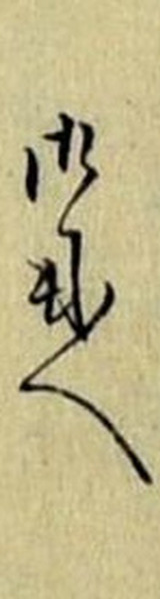御用人
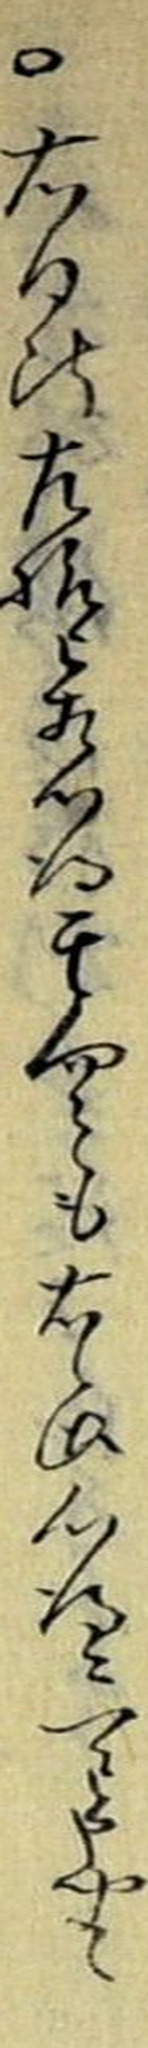○右同断左様被相心得其向々へも右之趣心得に可被申聞候
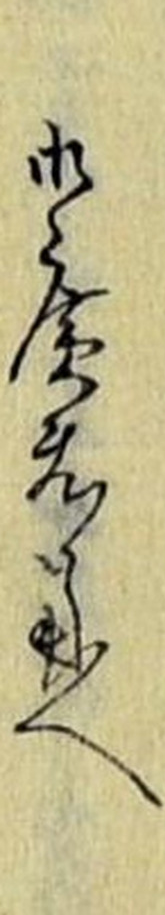御広敷御用人
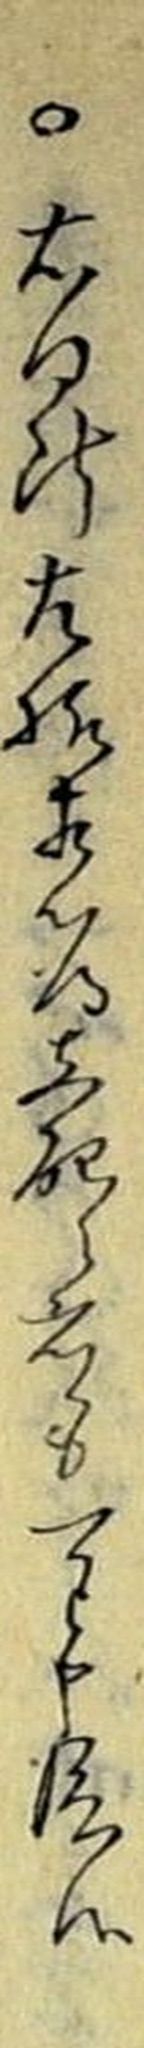○右同断左様相心得支配之者へも可被申渡候
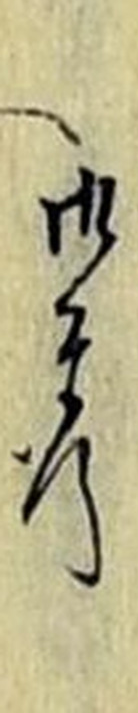御奉行
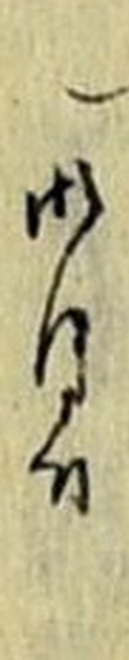御目付
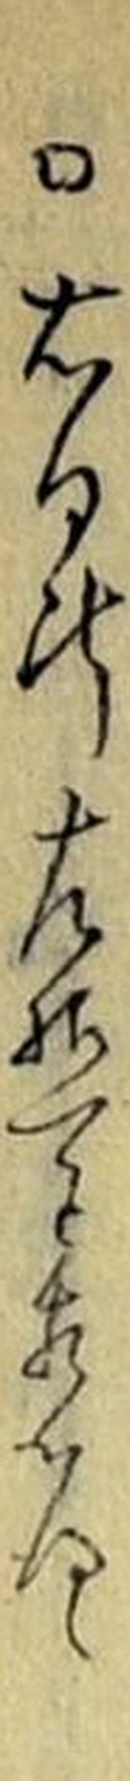○右同断左様可被相心得候
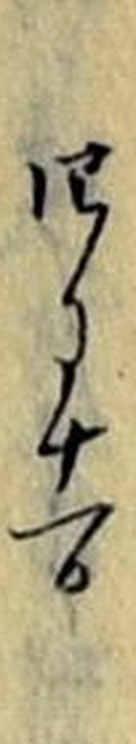四月十一日
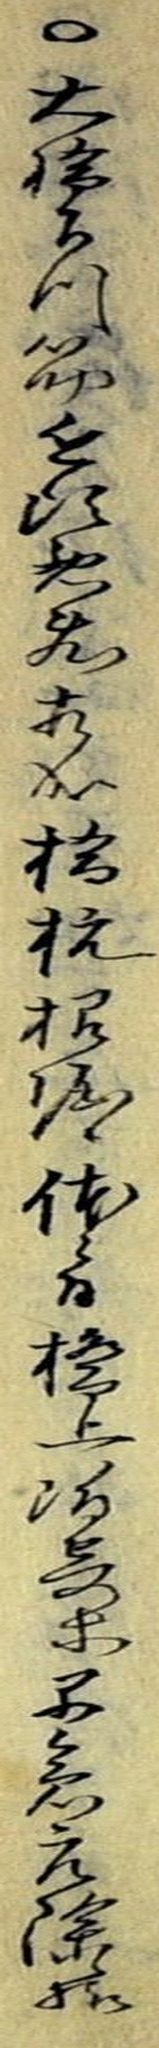○大橋下川筋近頃悪敷相成橋杭根堀候体に付橋上附寄等早急取除候様
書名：命令之部 六
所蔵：福井県文書館 Fukui Prefectural Archives
